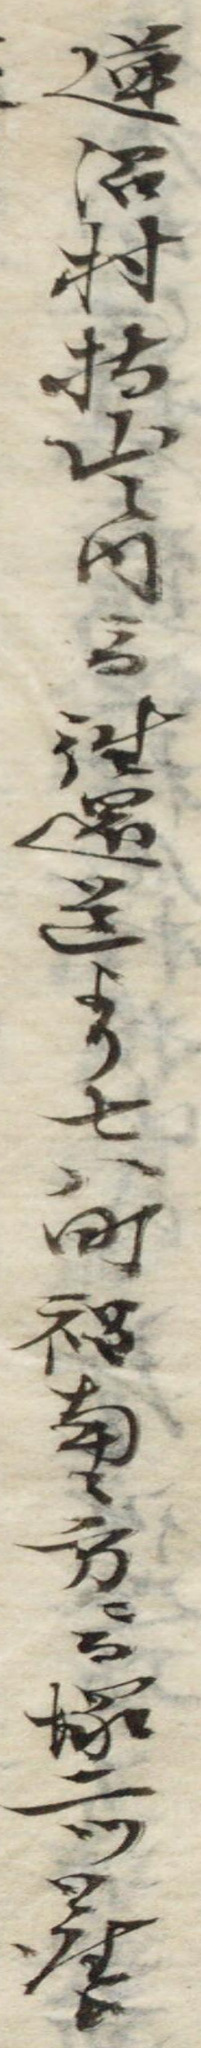蓮沼村持山之内に而往還道より七八町程南之方に而塚二ッ御座候
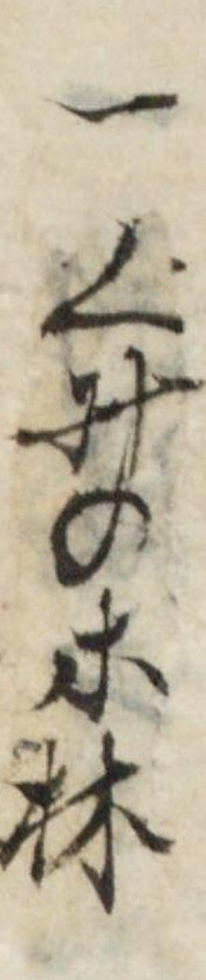一く井の木林
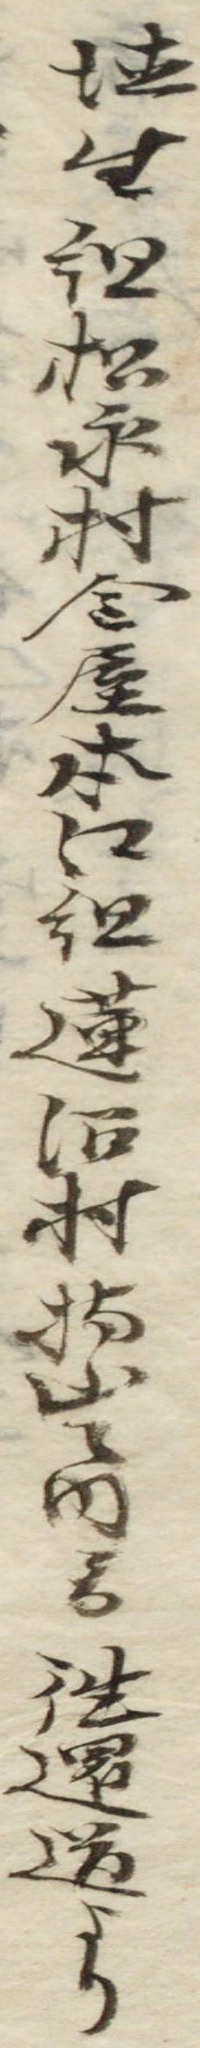埴生組松永村金屋本郷組蓮沼村持山之内に而往還道より
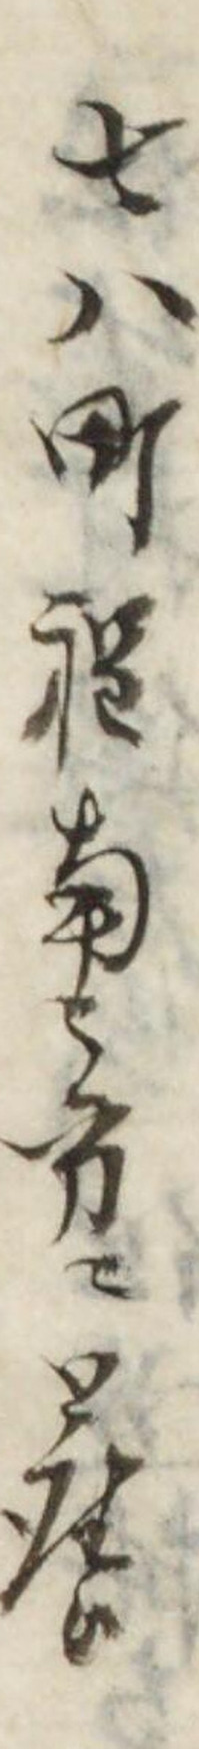七八町程南之方に御座候
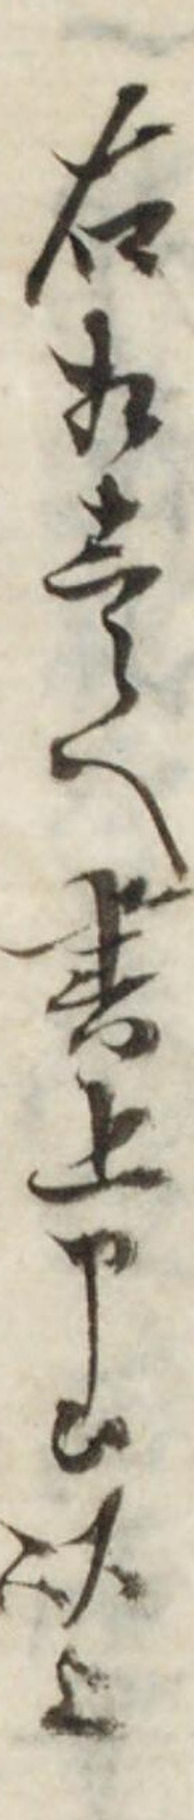右相しらへ書上申候以上
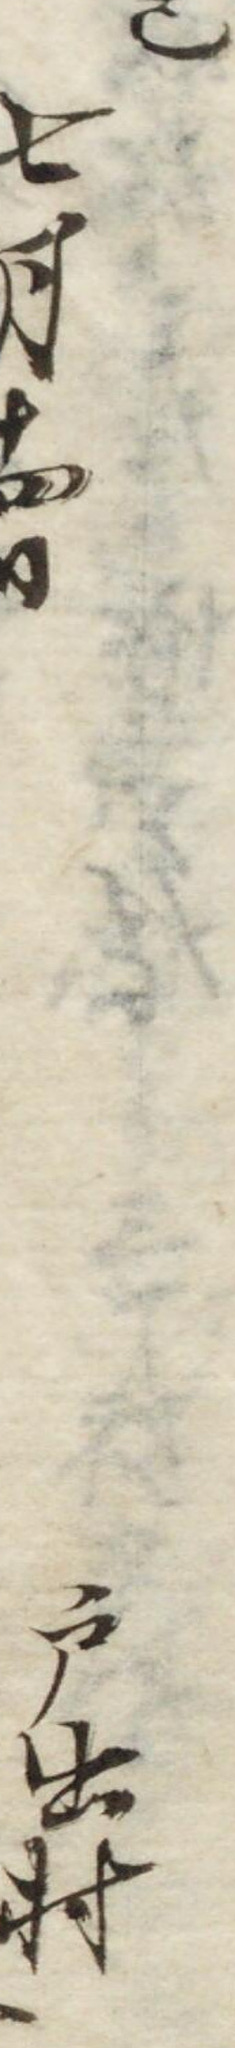七月十四日戸出村
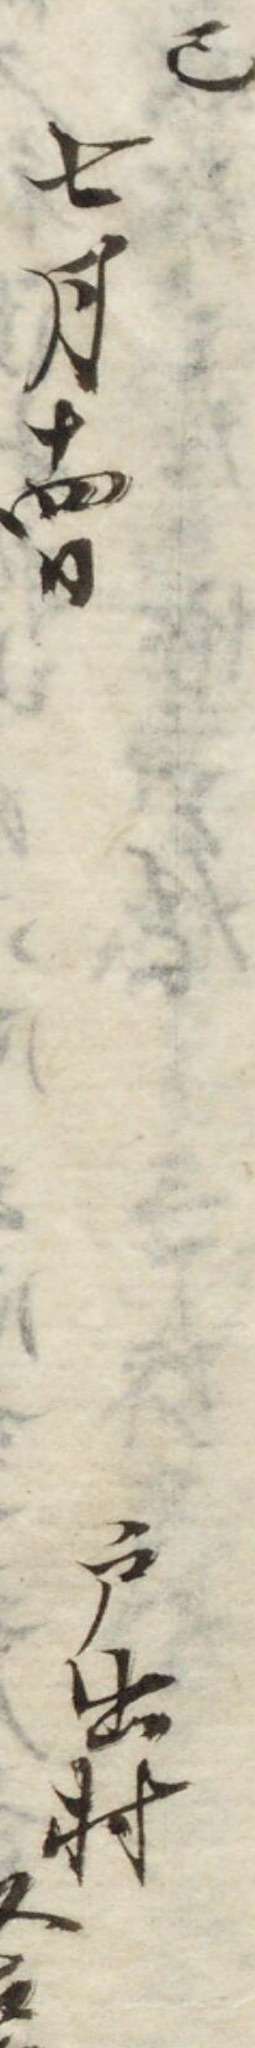七月十四日戸出村
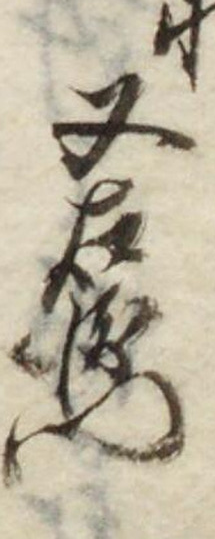又右衛門
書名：加越能旧聞録
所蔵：Ishikawa Prefectural Library
